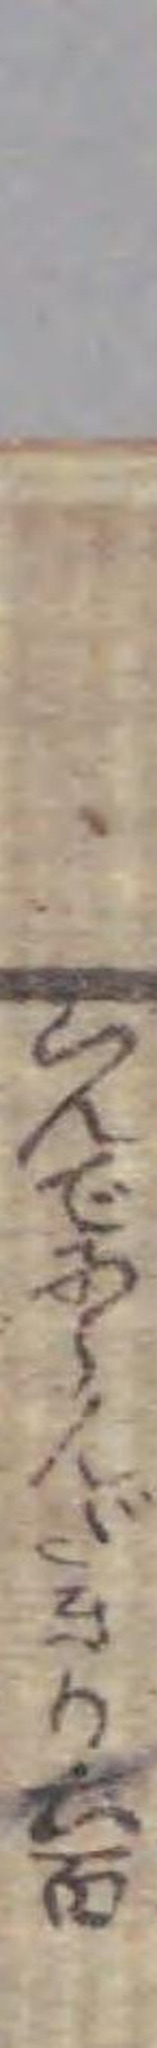くんでにらんだきり六百
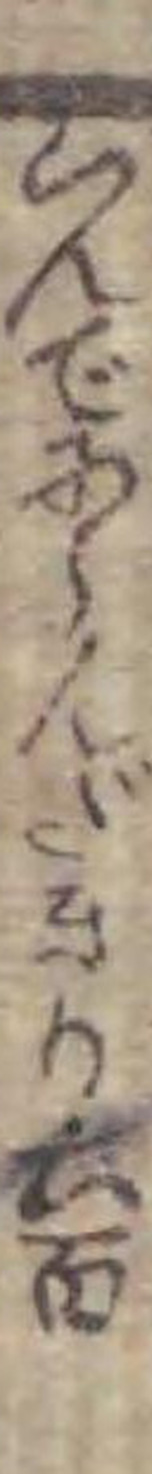くんでにらんだきり六百
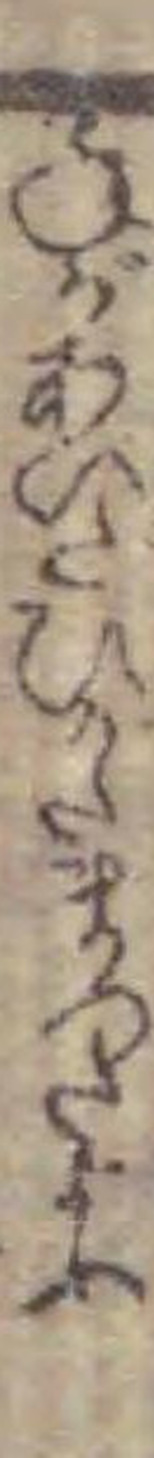年があいだひかたまつたよふ
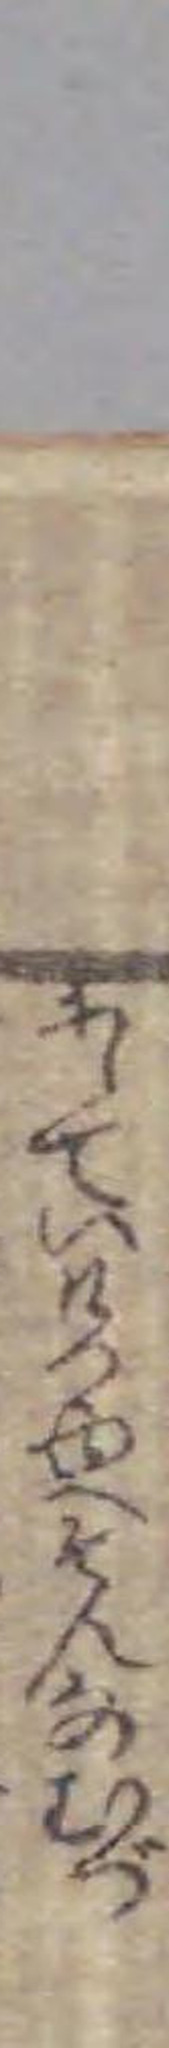にしていけつゆへそんなむづ
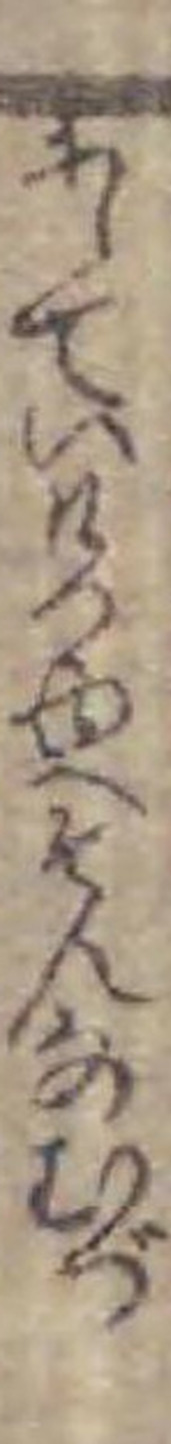にしていけつゆへそんなむづ
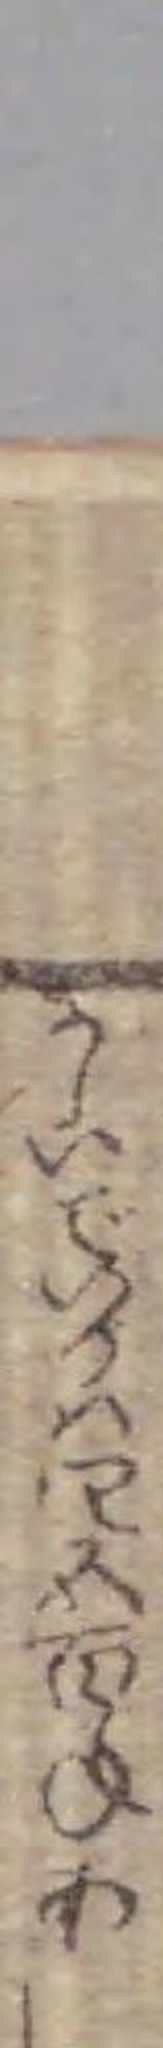かしいでいりは四五百年あ
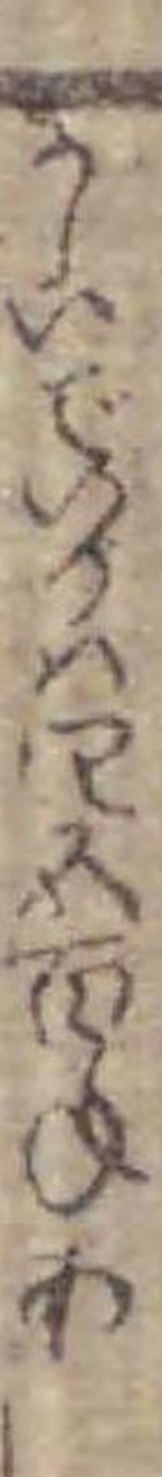かしいでいりは四五百年あ
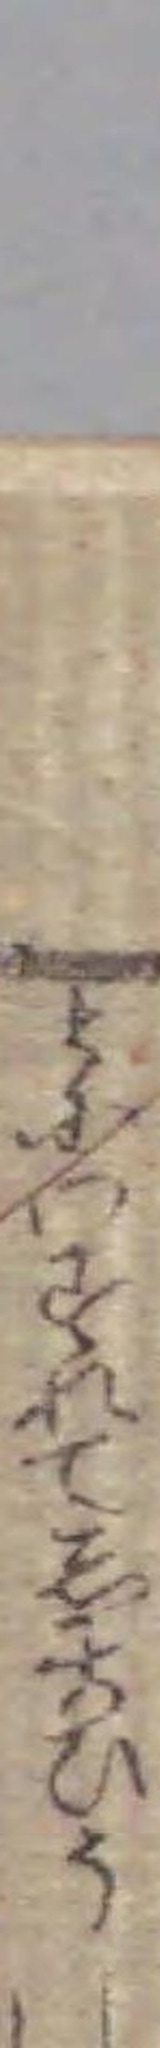とにわすれてしまひう
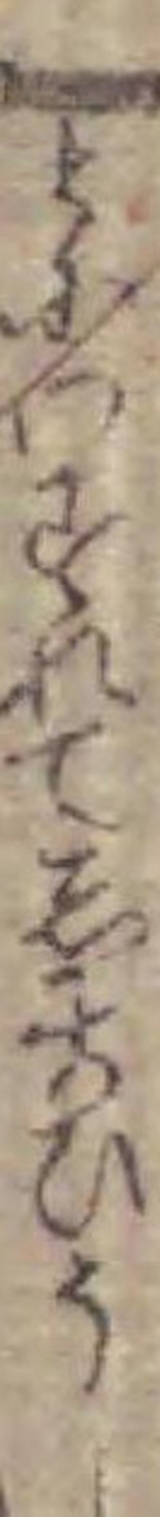とにわすれてしまひう
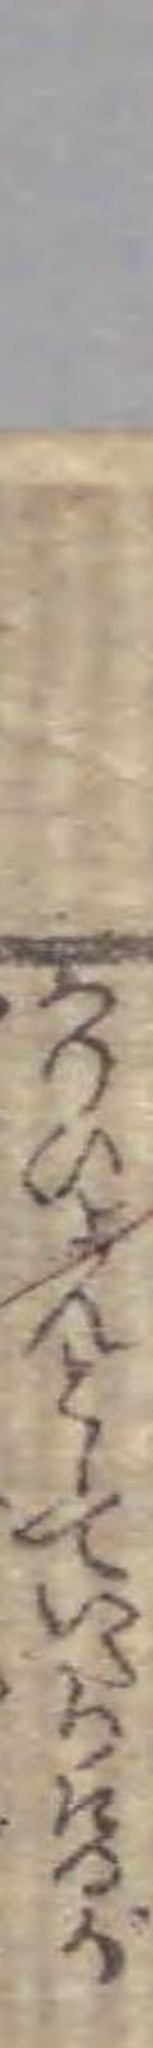つりひよんとしていたりけるが
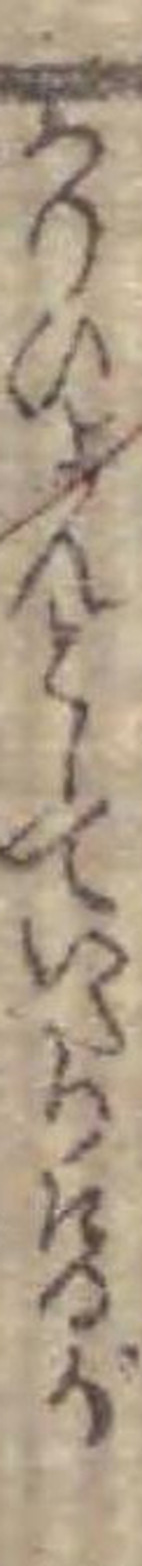つりひよんとしていたりけるが
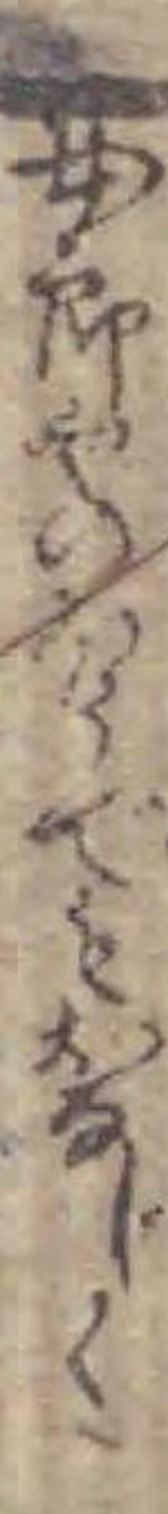女郎やのほうでもおなじく
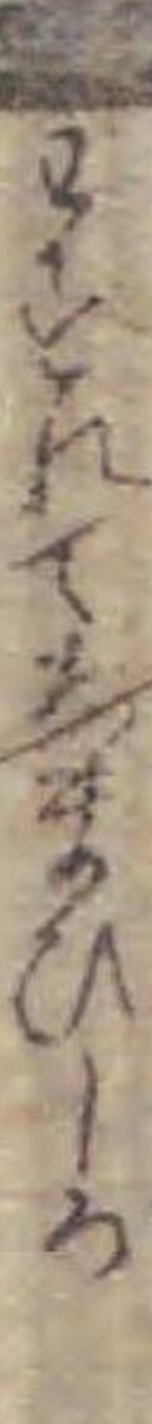わすれてしまひしか
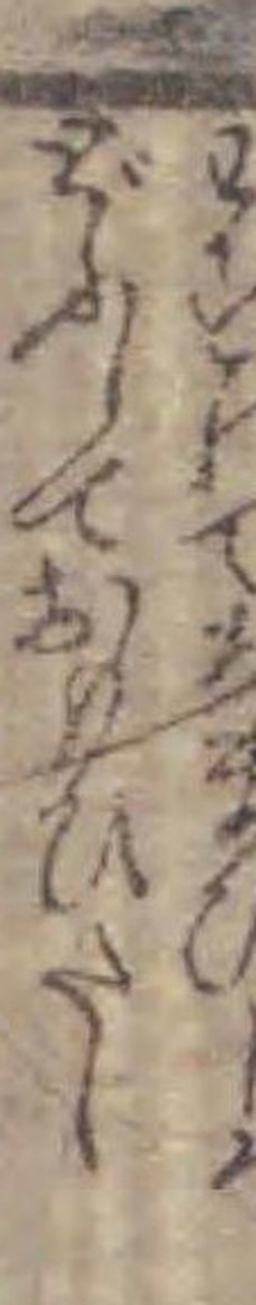どふしておもひたし
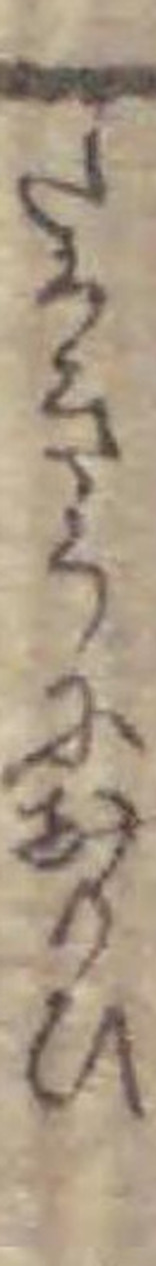たかきうにおもひ
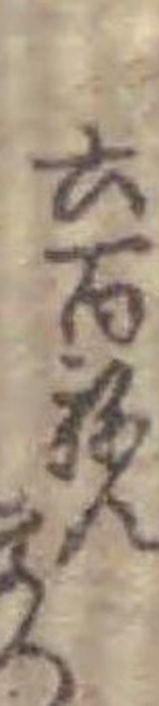六百ねん
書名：年寄之冷水曽我 : 3巻
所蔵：国立国会図書館 National Diet Library, JAPAN
